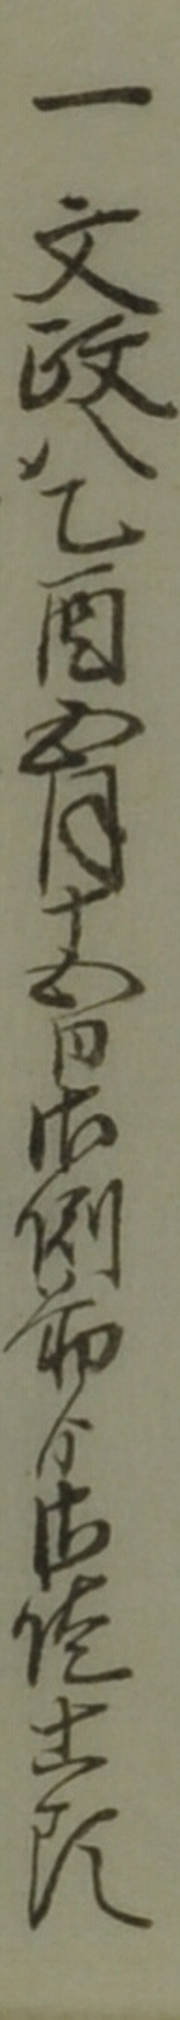一文政八乙酉五月十五日御側勤ゟ御徒士頭
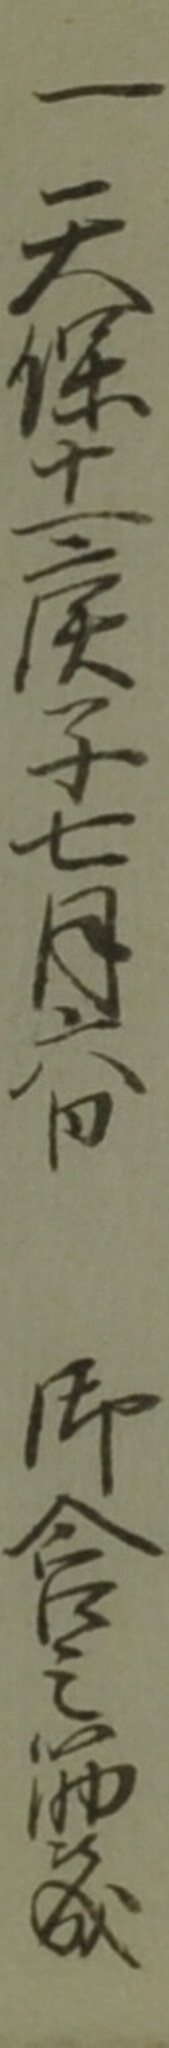一天保十一庚子七月六日御含之筋被成
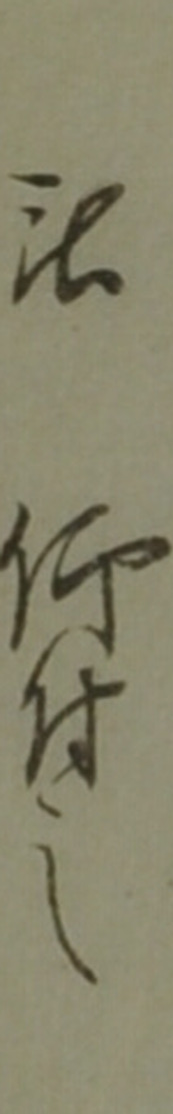被仰付之
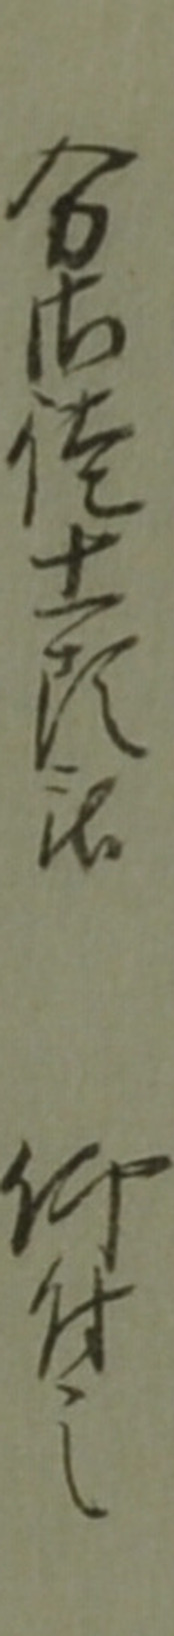分御徒士頭被仰付之
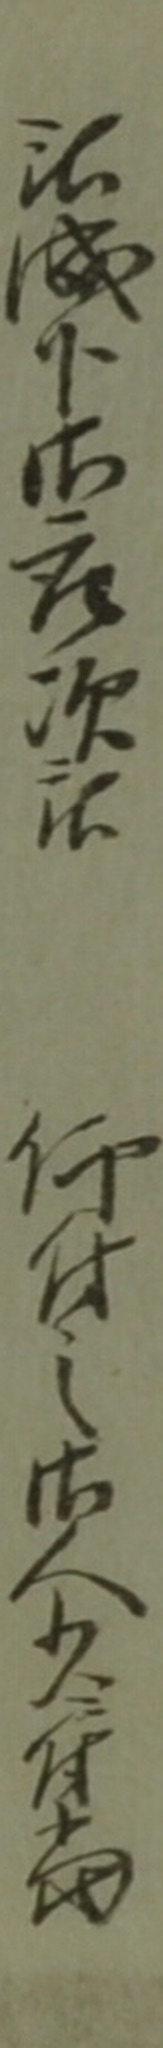被成下御取次被仰付之御人少ニ付当
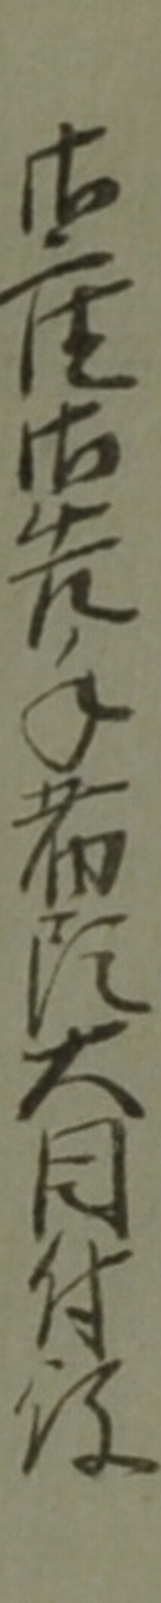御座御先手者頭大目付役
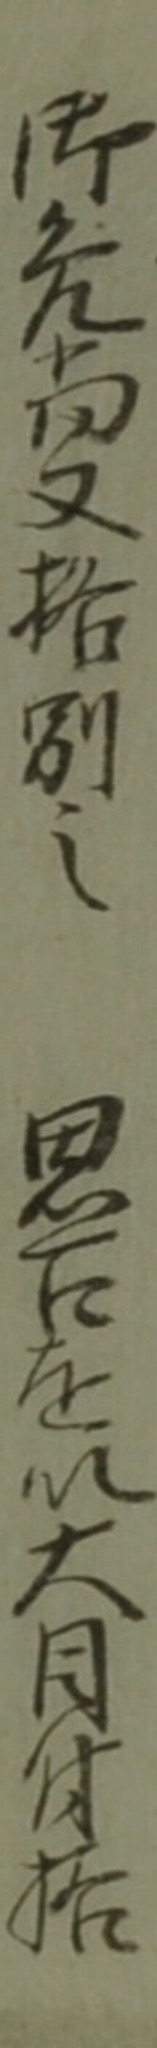御免尚又格別之思召を以大目付格
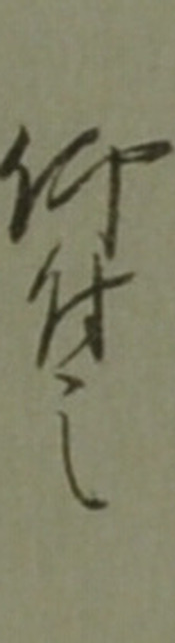仰付之
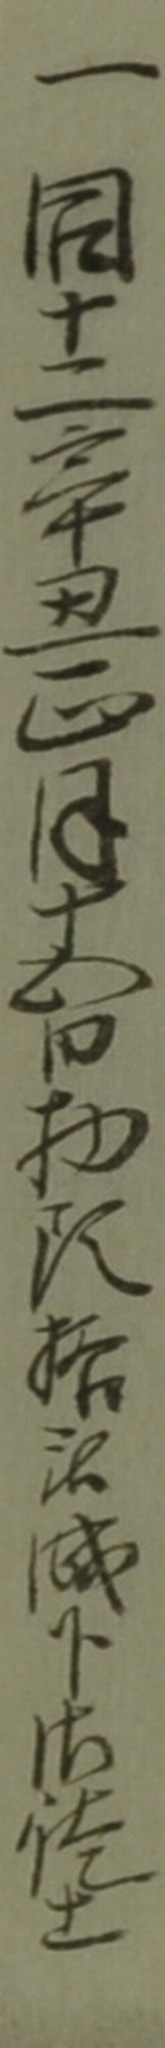一同十二辛丑正月十五日物頭格被成下御徒士
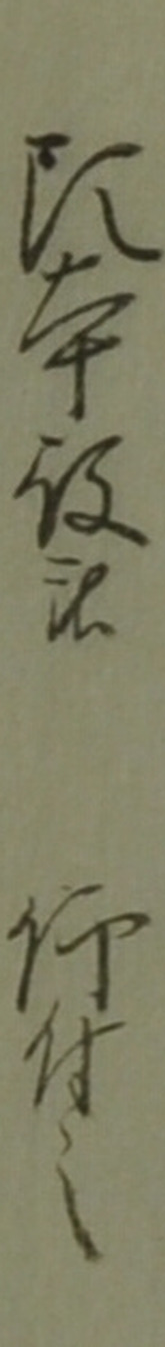御本役被仰付之

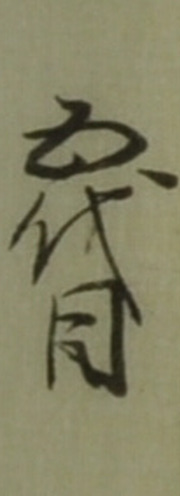五代目
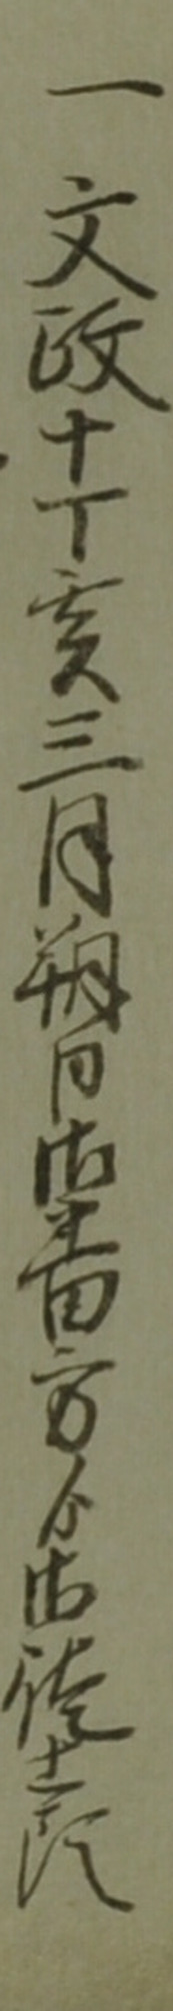一文政十丁亥三月朔日御番方ゟ御徒士頭
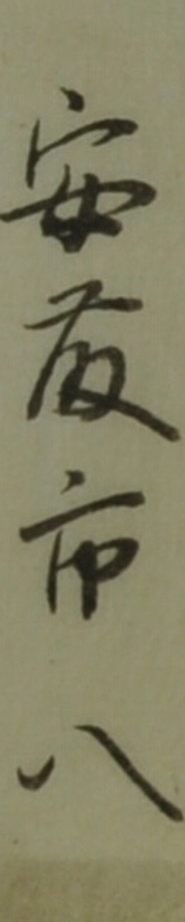安藤市八
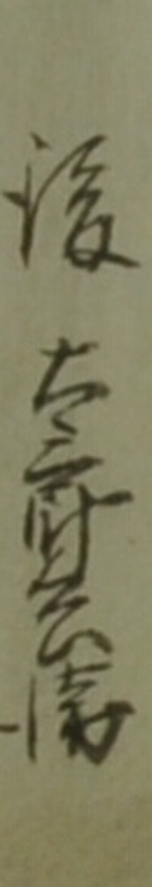後太郎兵衛
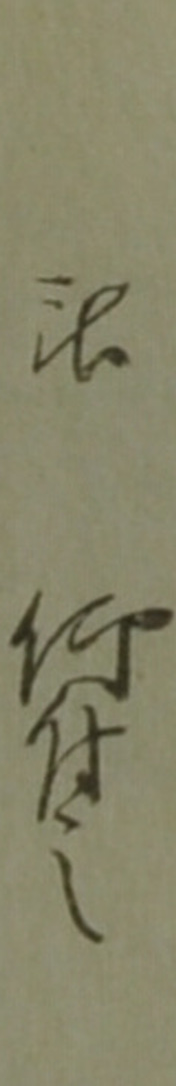被仰付之
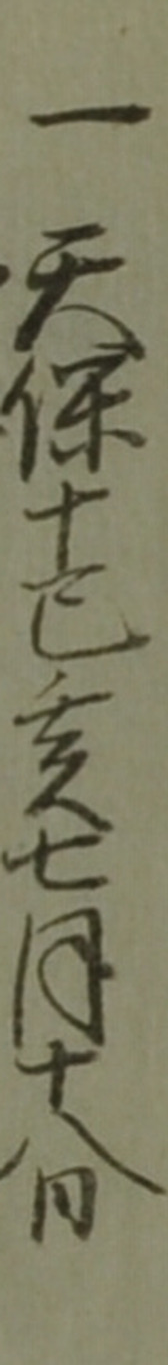一天保十己亥七月十八日
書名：諸御役代々録（六）
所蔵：伊那市立高遠町図書館・合同会社AMANE
